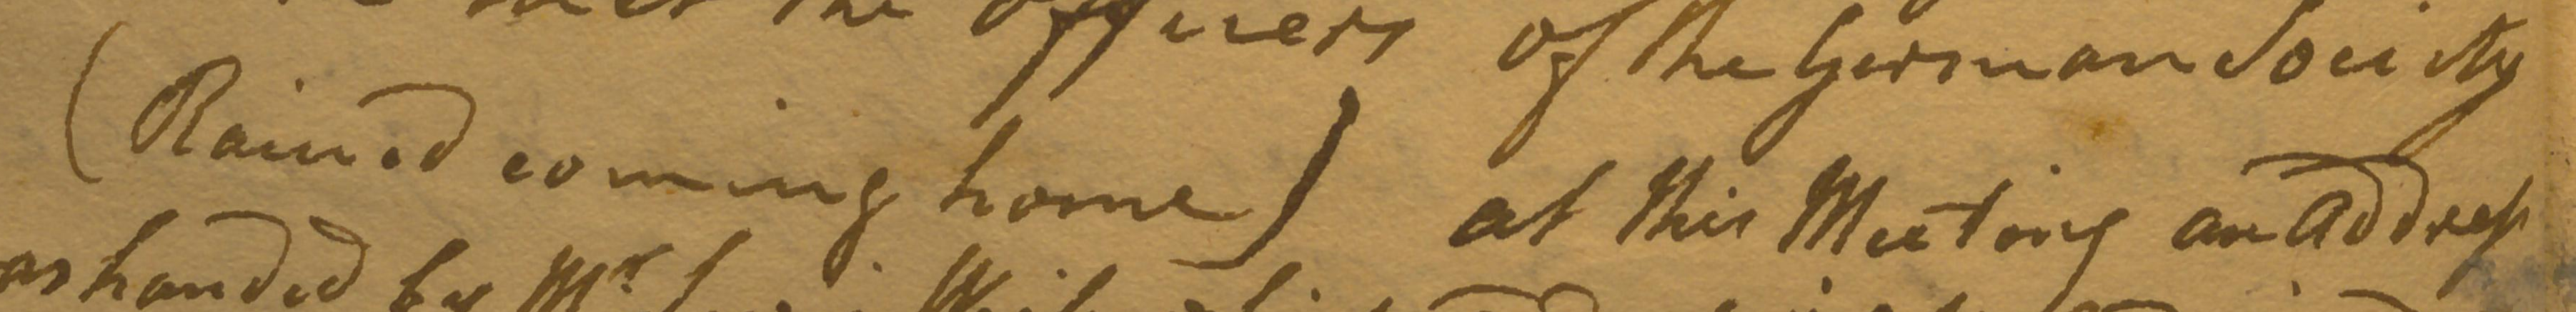(Rained coming home) at this Meeting an Address
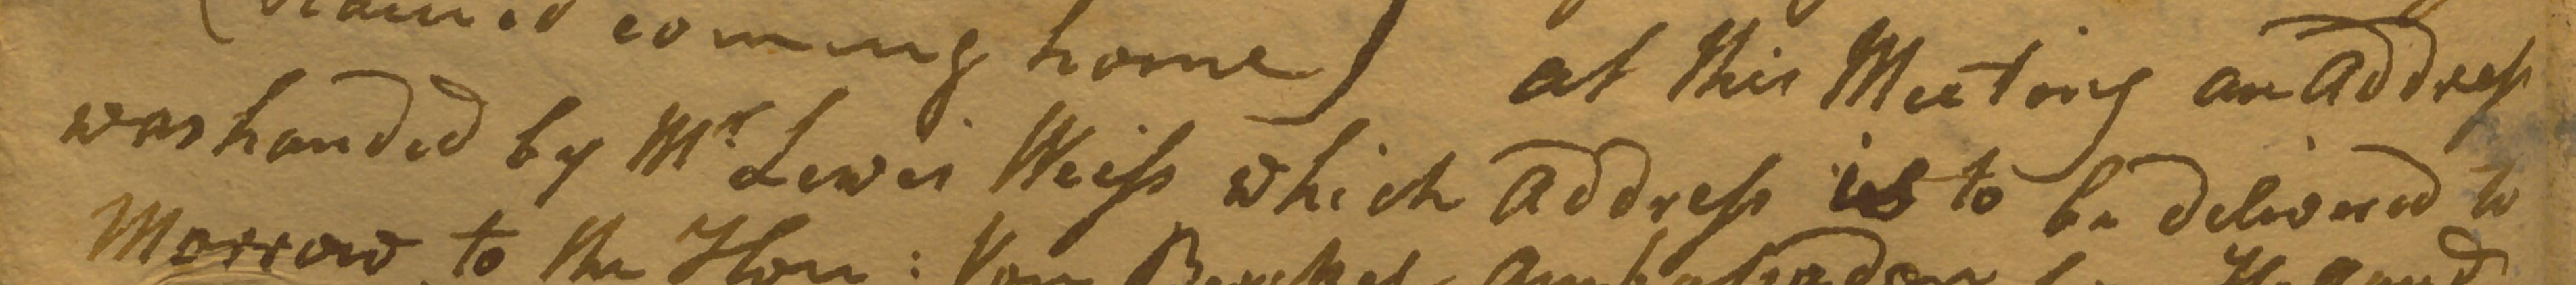was handed by M^r Lewis Weiss which address is to be delivered to
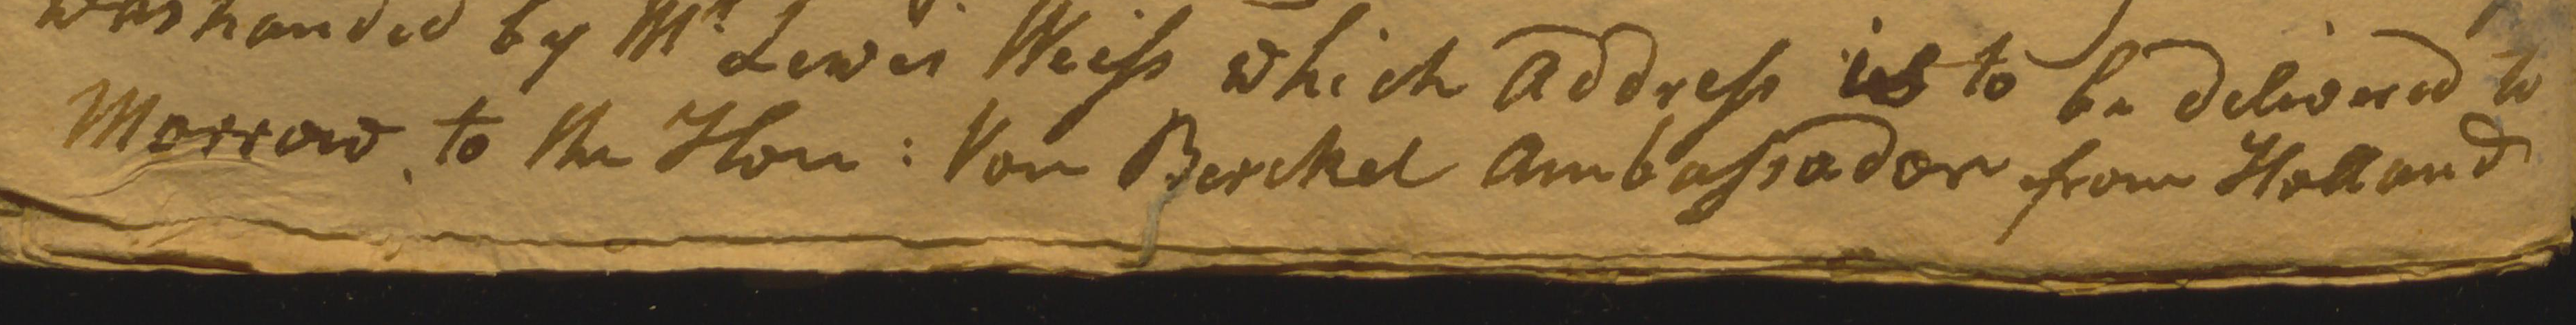Morrow to the Hon: Von Berckel Ambassador from Holland
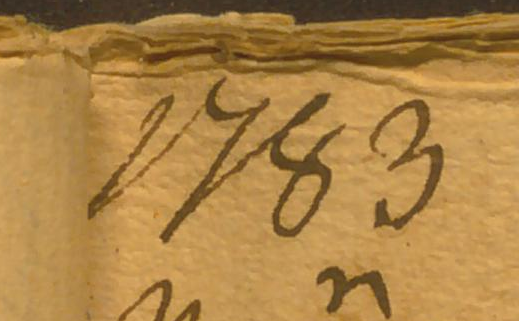1783
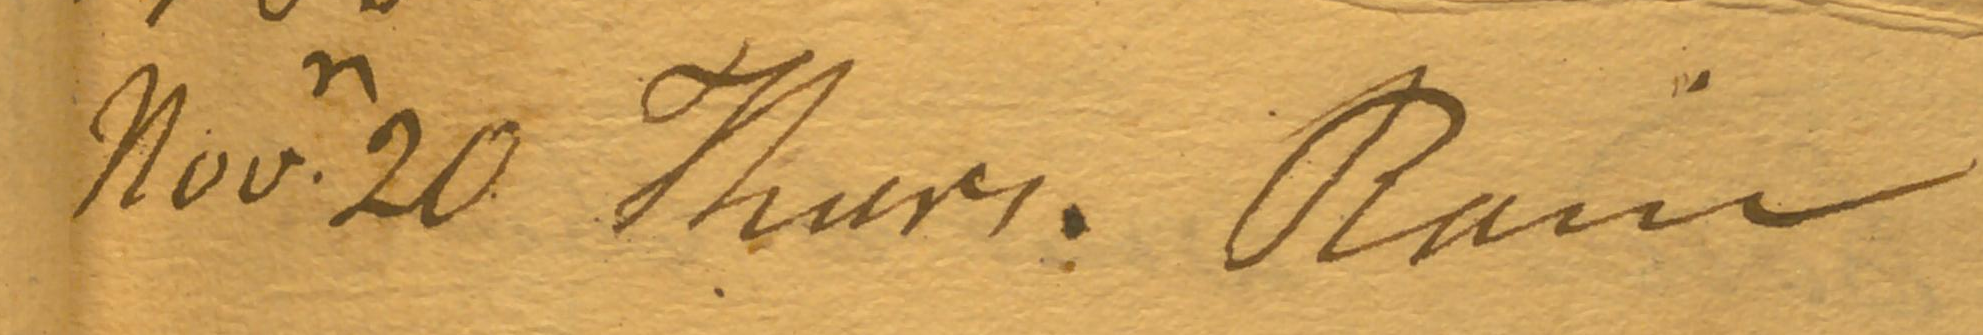Nov^r. 20 Thurs. Rain
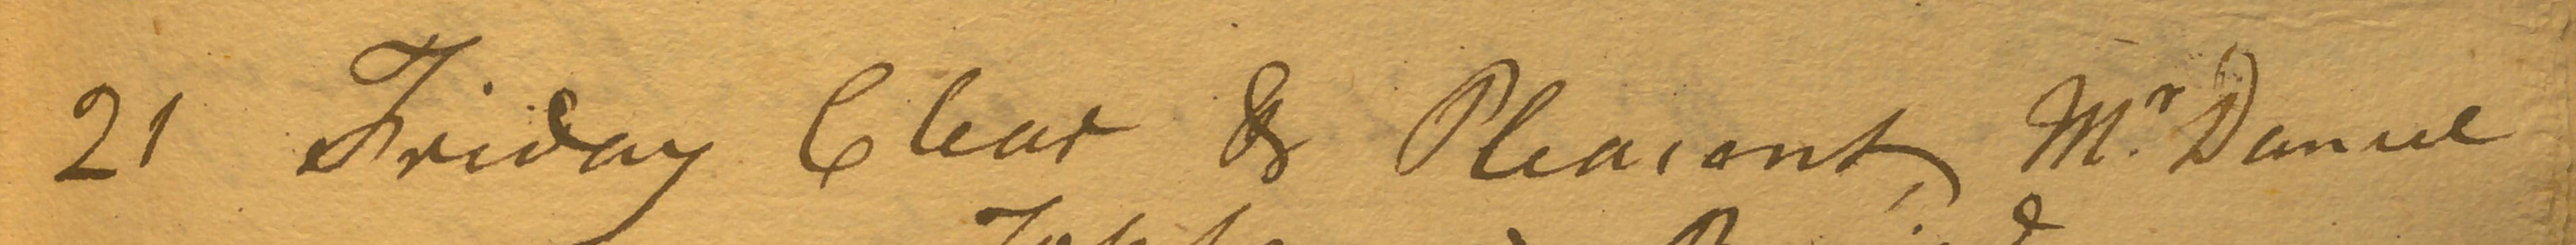21 Friday Clear & Pleasant M^r. Daniel
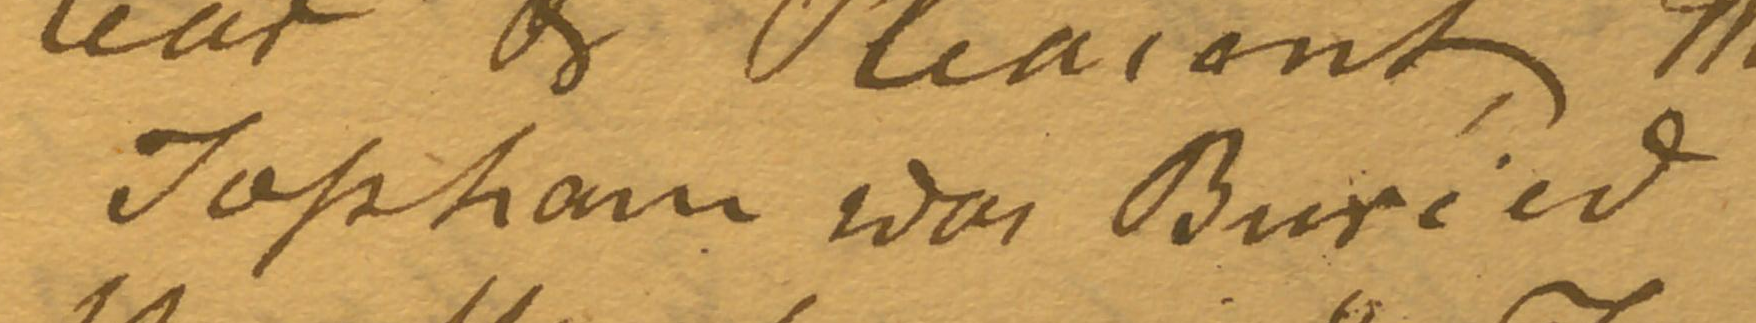Topham was Buried
